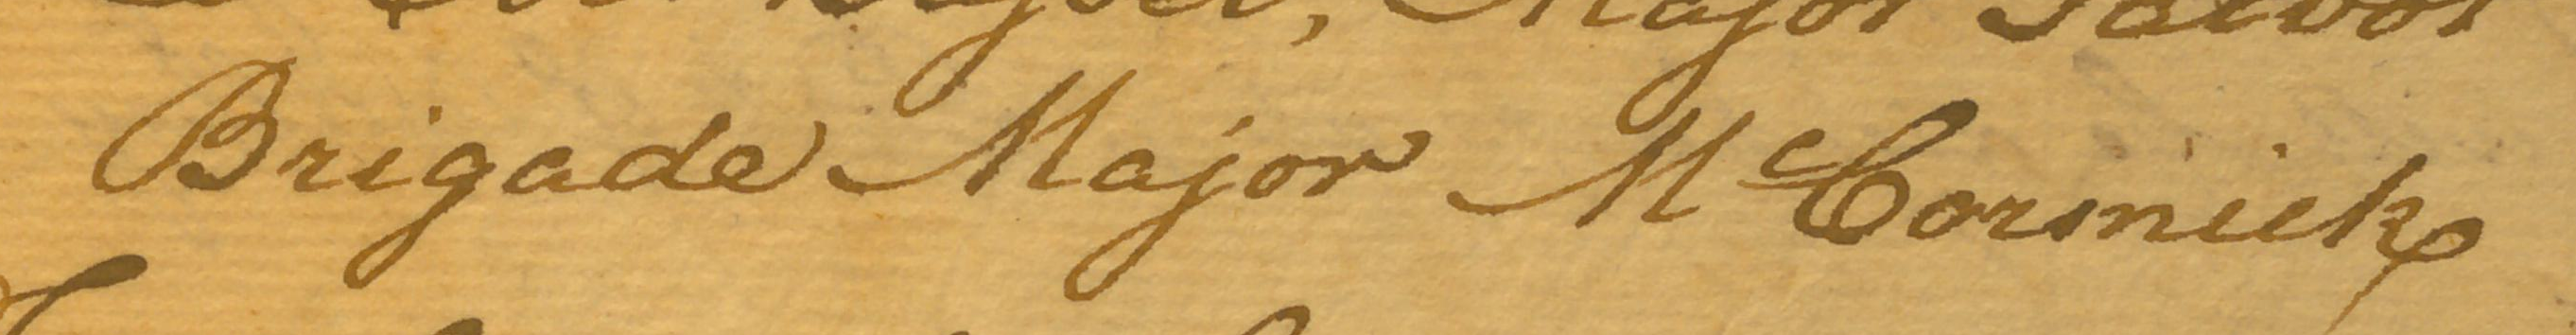Brigade Major M^cCormick
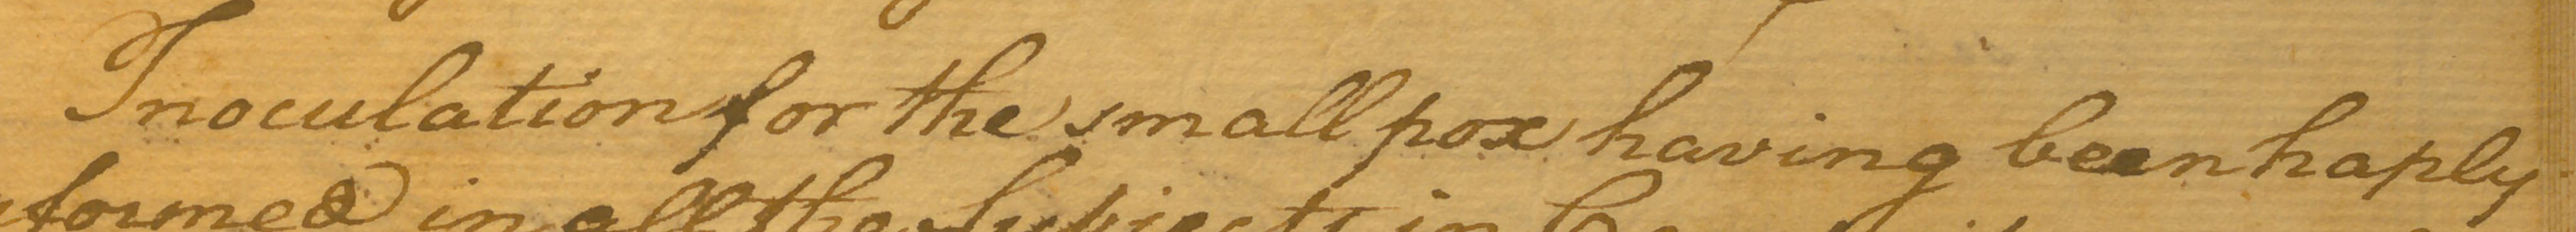Inoculation for the small pox having been haply
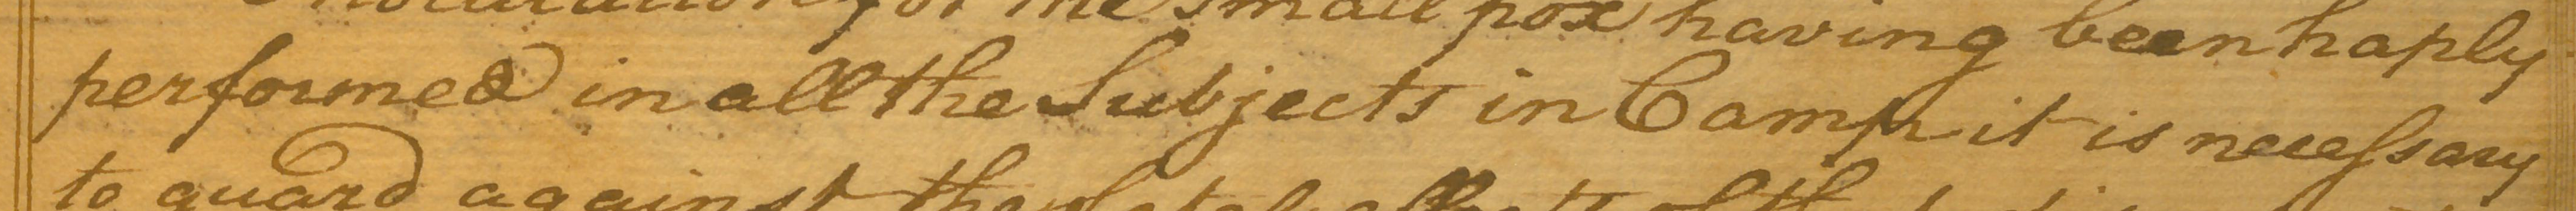performed in all the Subjects in Camp it is necessary
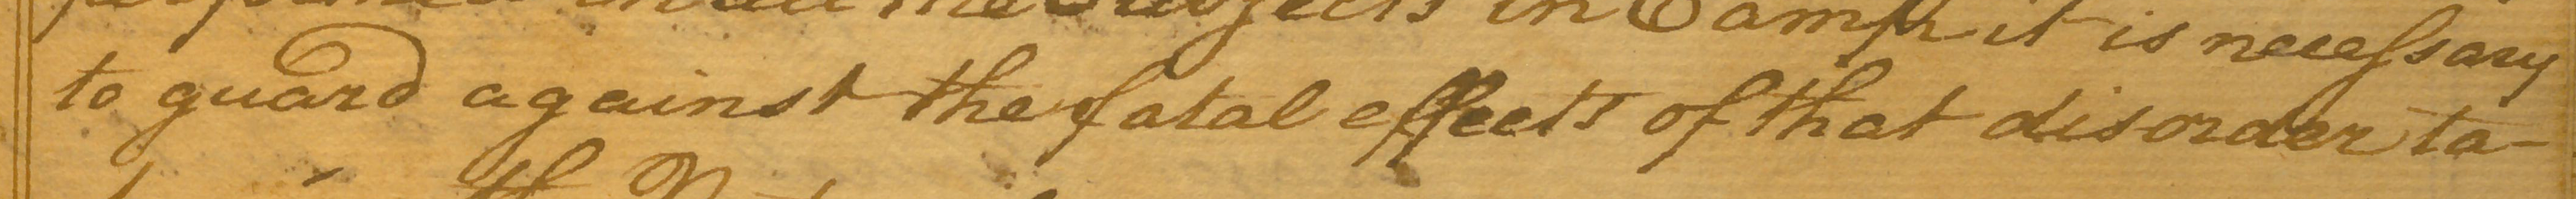to guard against the fatal effects of that disorder ta-
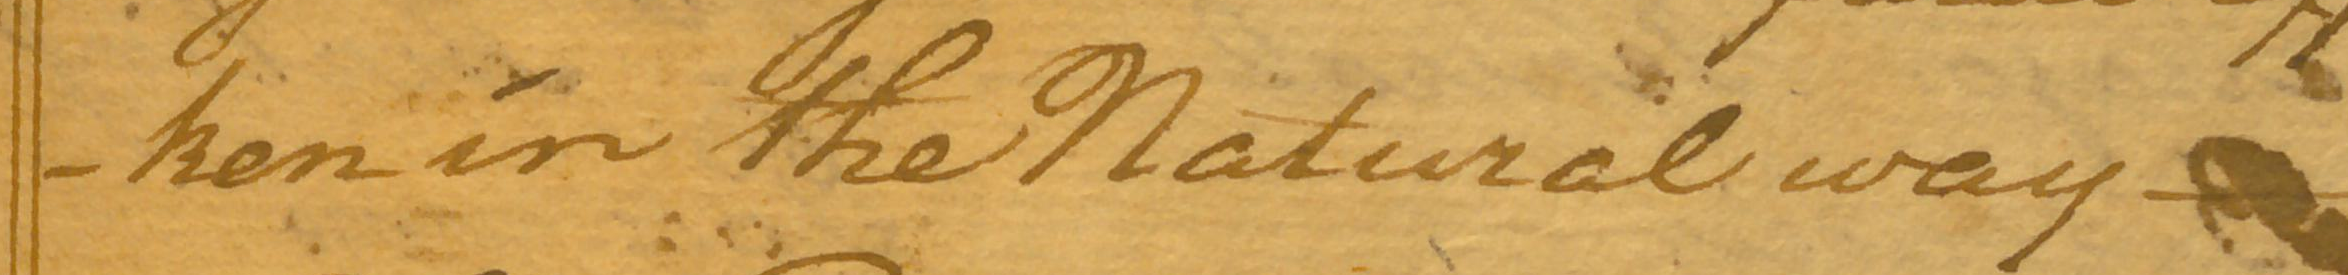-ken in the Natural way-
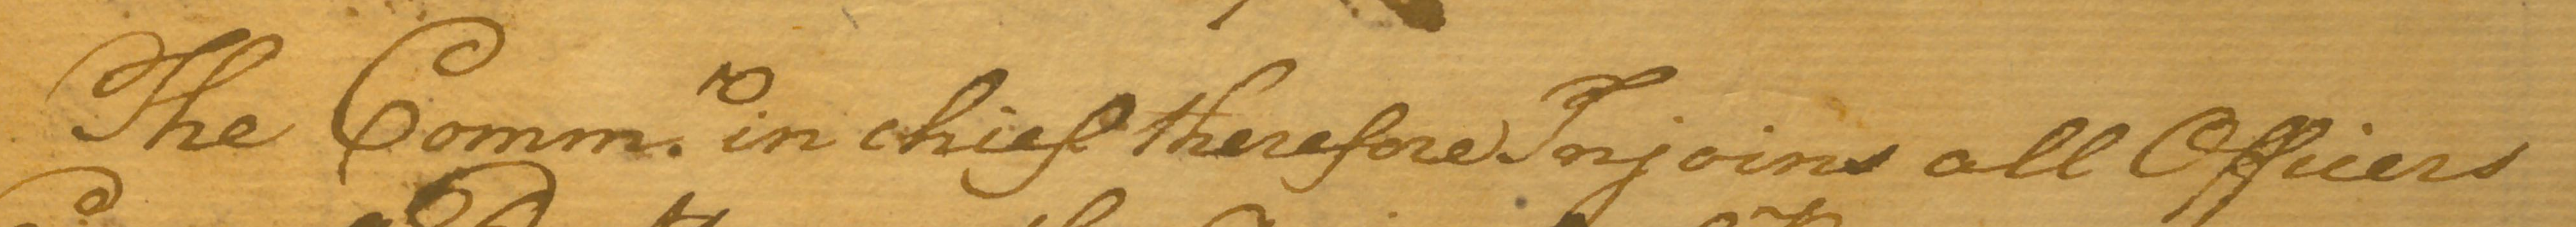The Comm^r. in chief therefore Injoins all Officers
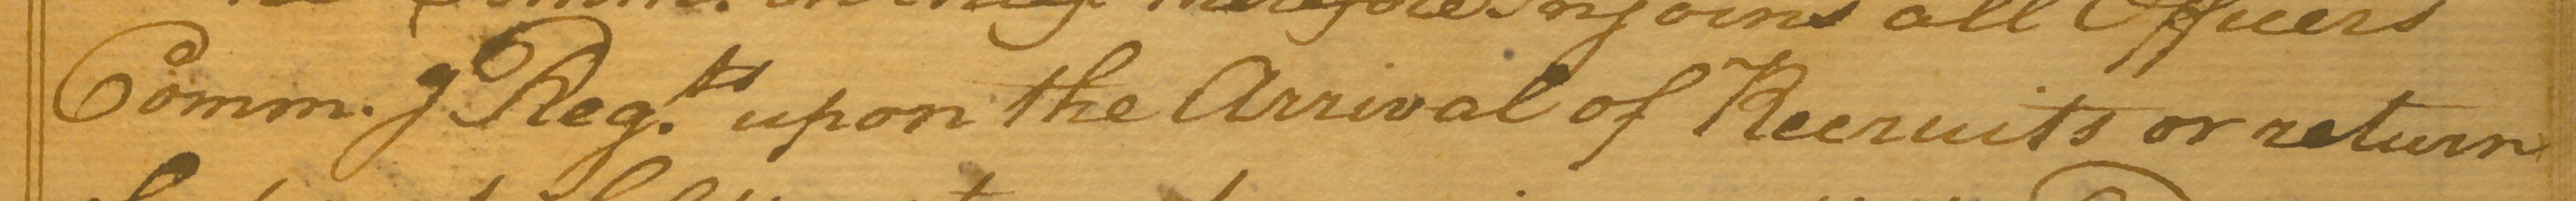Comm^g. Reg^ts. upon the Arrival of Recruits or return
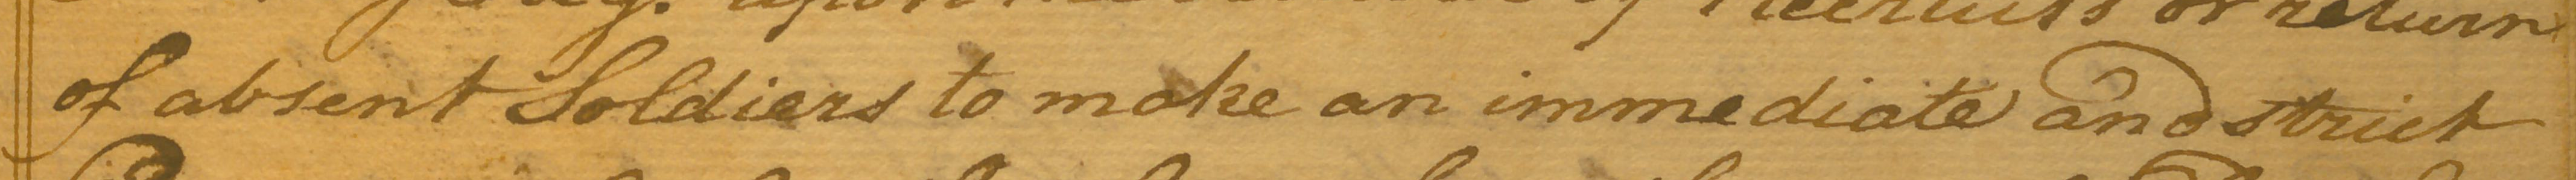of absent Soldiers to make an immediate and strict
